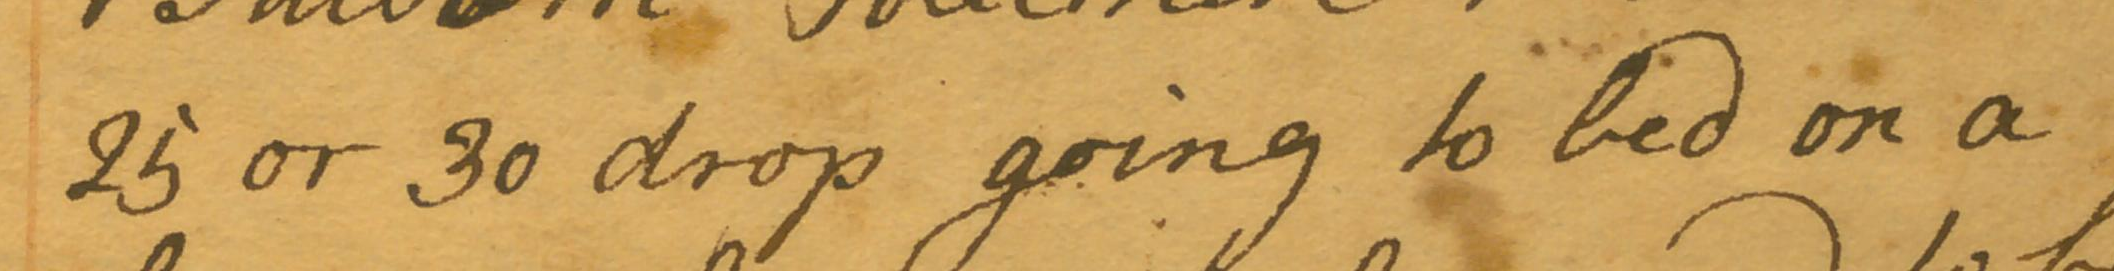25 or 30 drops going to bed on a
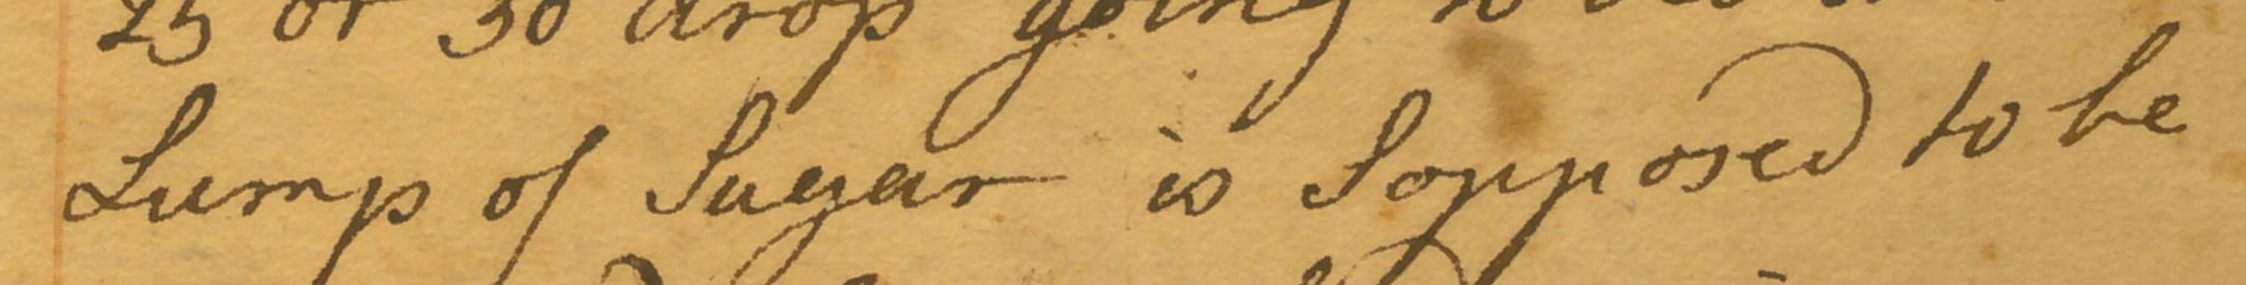Lump of sugar is supposed to be
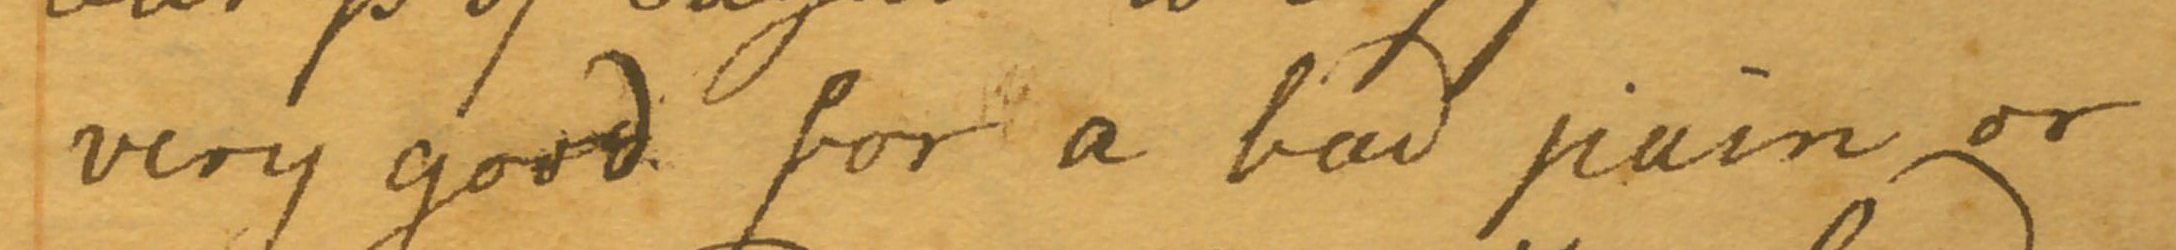very good for a bad pain or
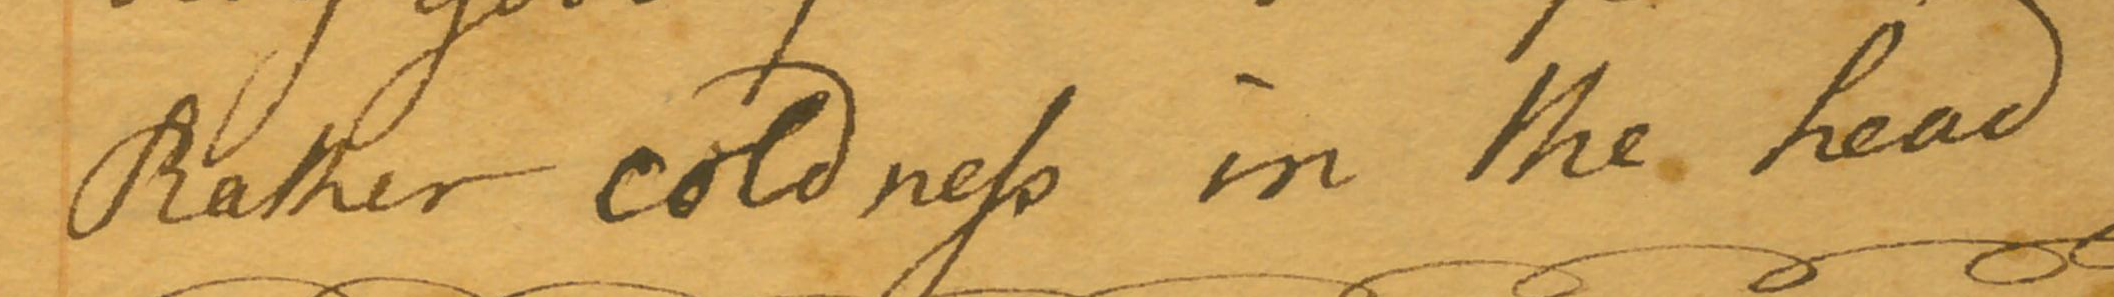Rather coldness in the head
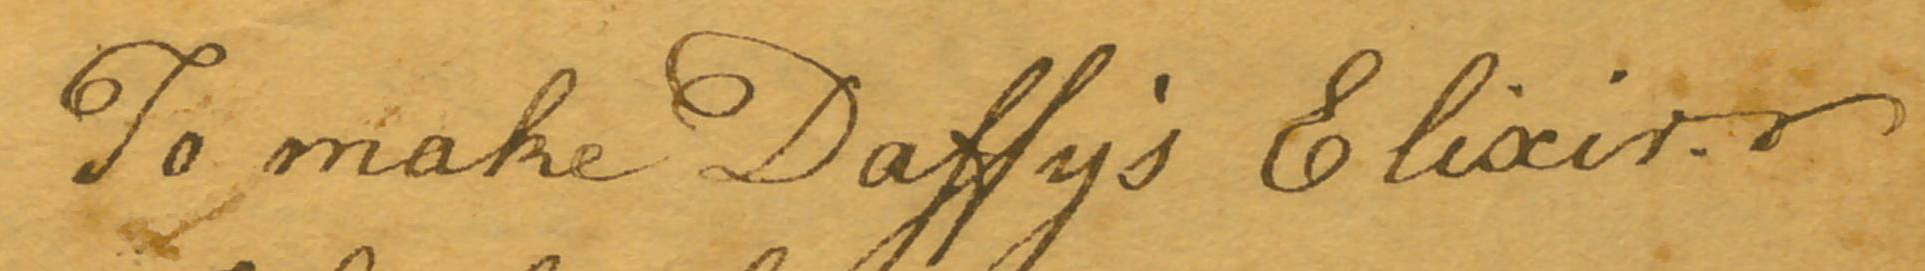To make Daffy's Elixir
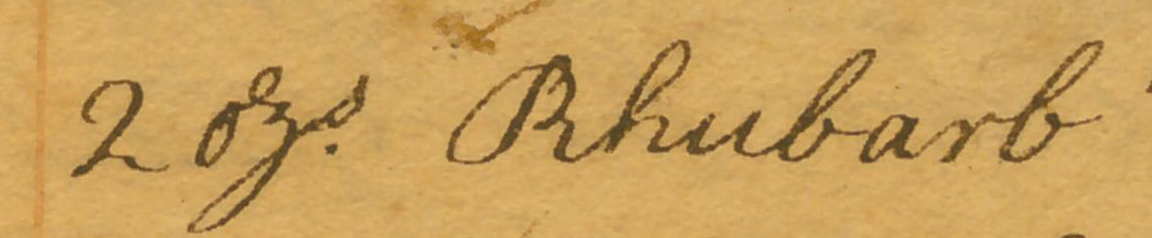2 ozs. Rhubarb
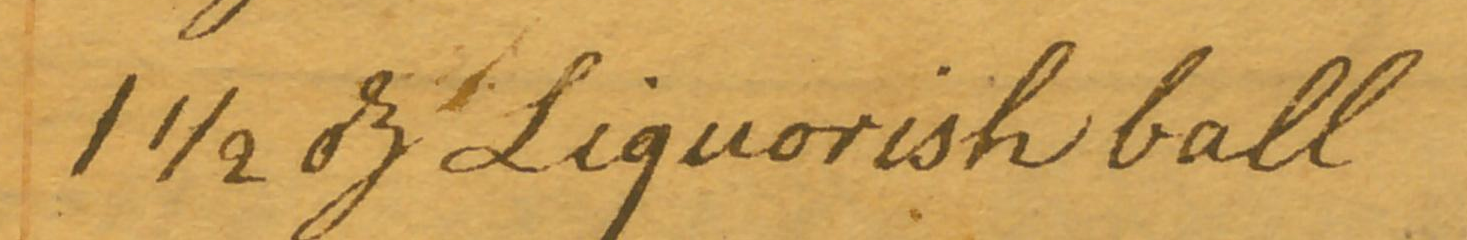1 1/2 oz Liquorish ball
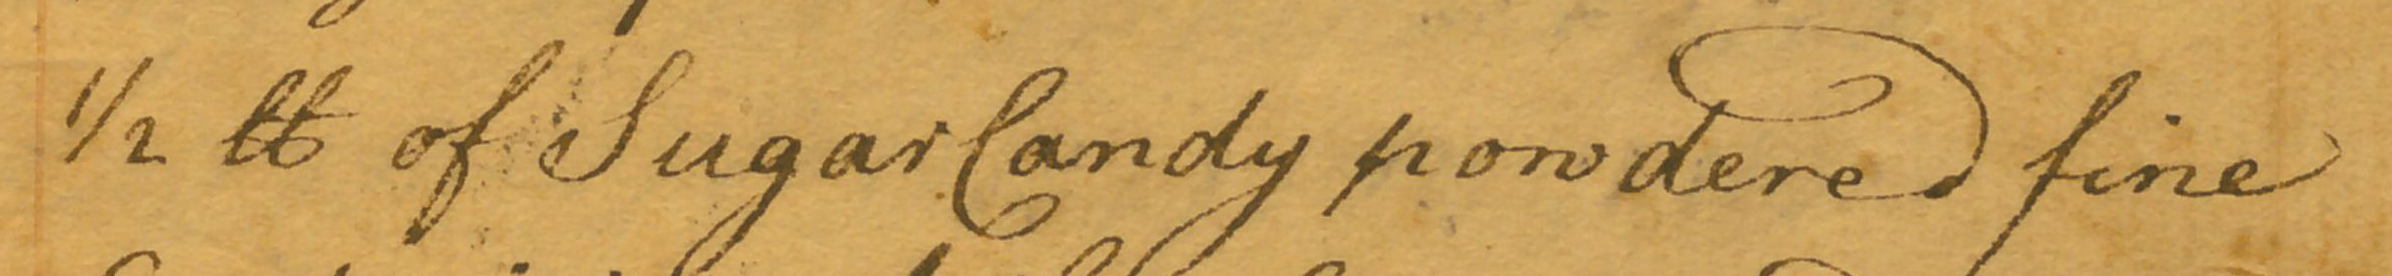1/2 lb of Sugar Candy powdered fine
